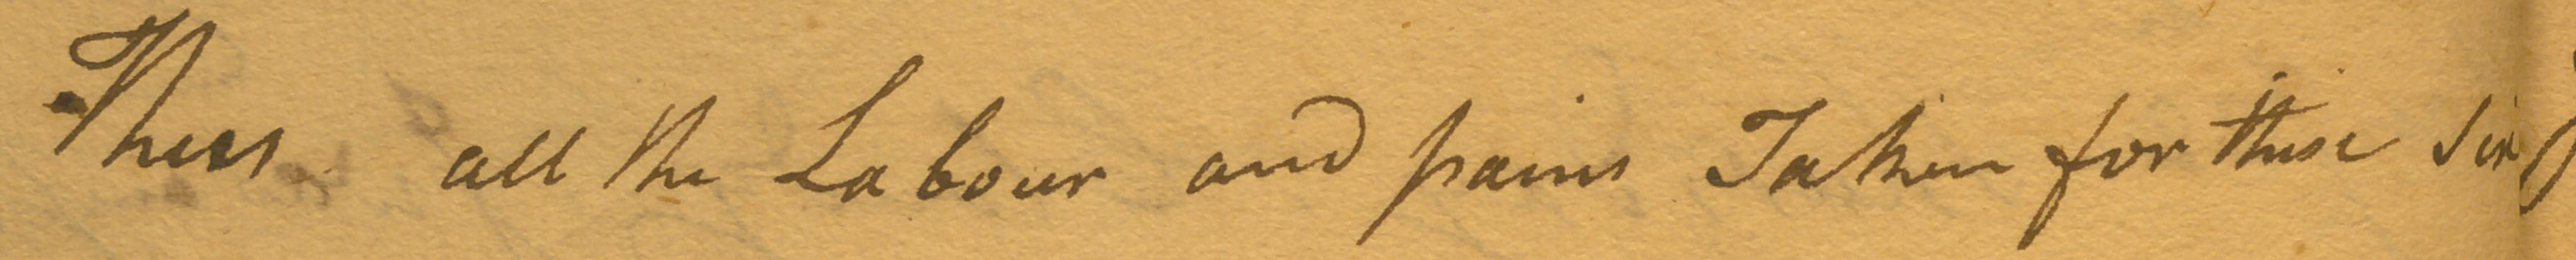Thus all the Labour and pains Taken for these six
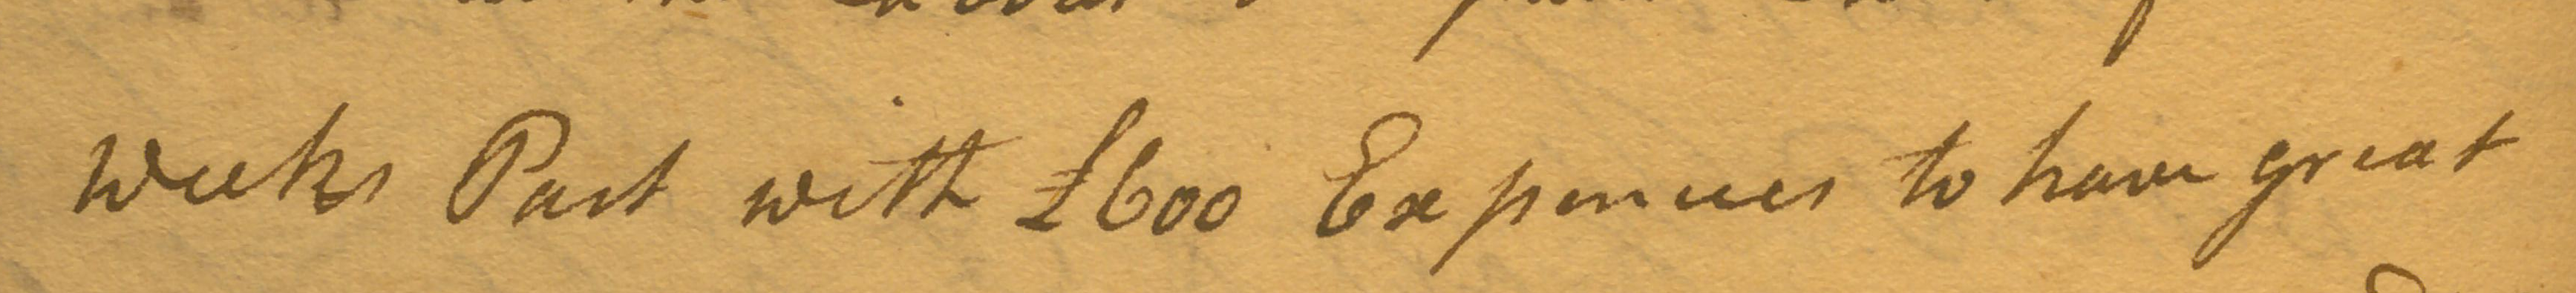weeks Past with £600 Expences to have great
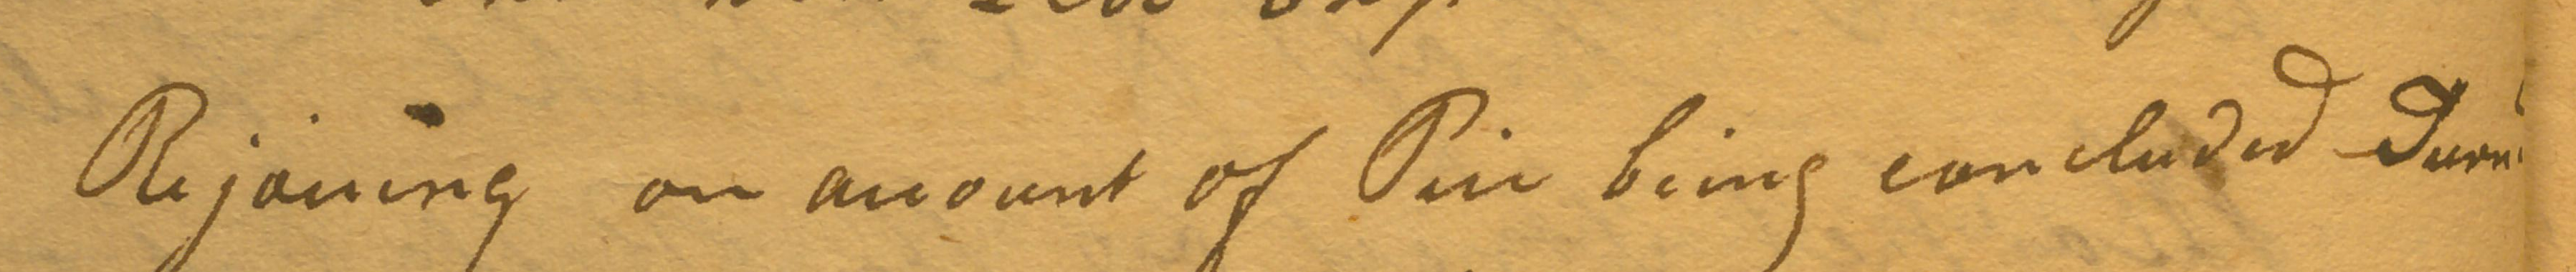Rejoining on account of Pice being concluded Turn
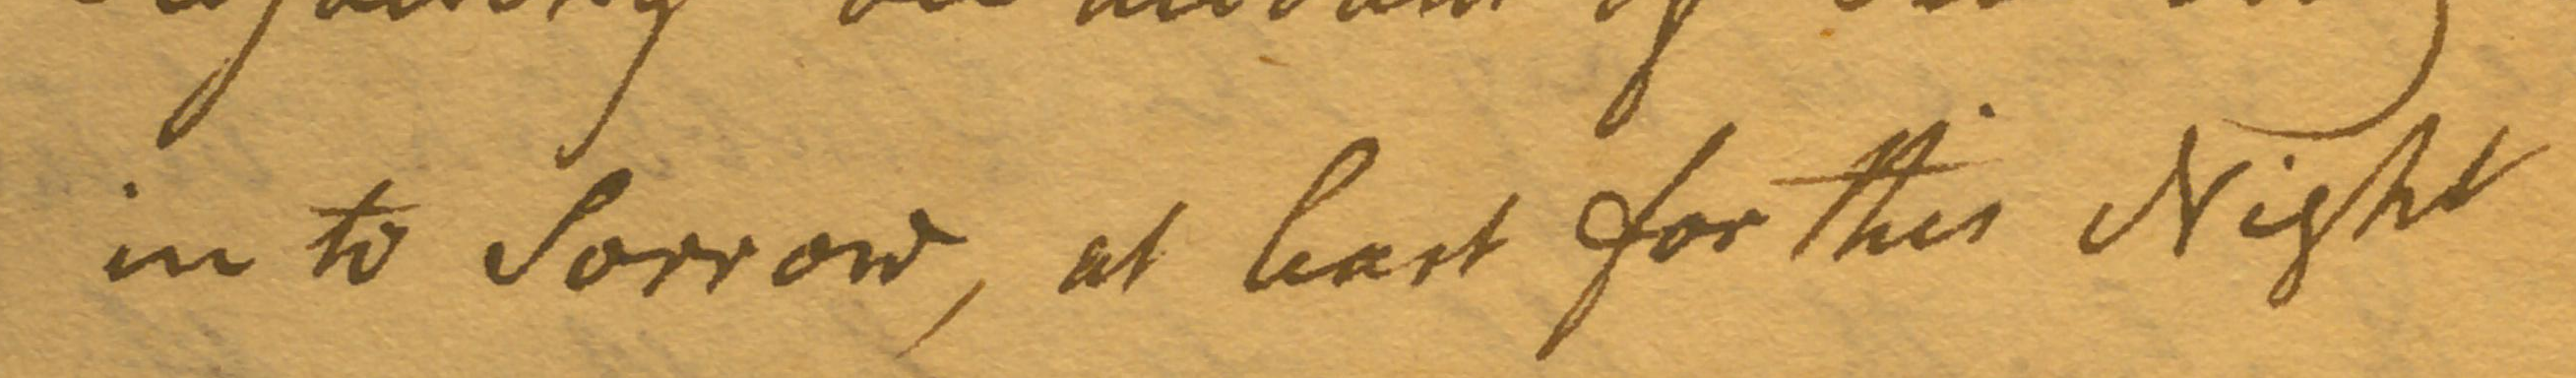in to sorrow, at least for this Night
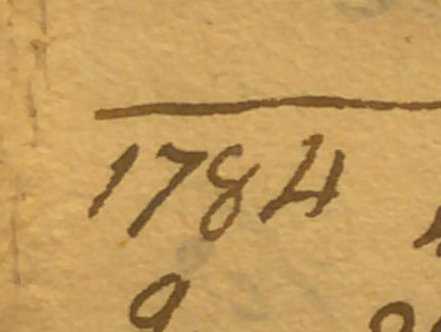1784
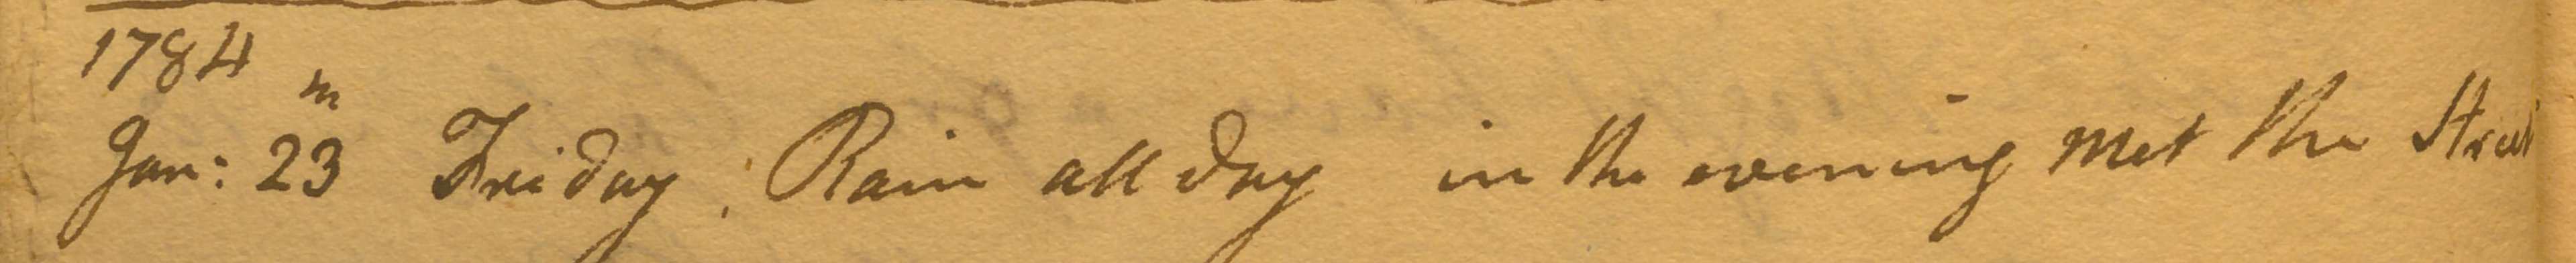Jan: 23^th Friday. Rain all day in the evening met the Street
